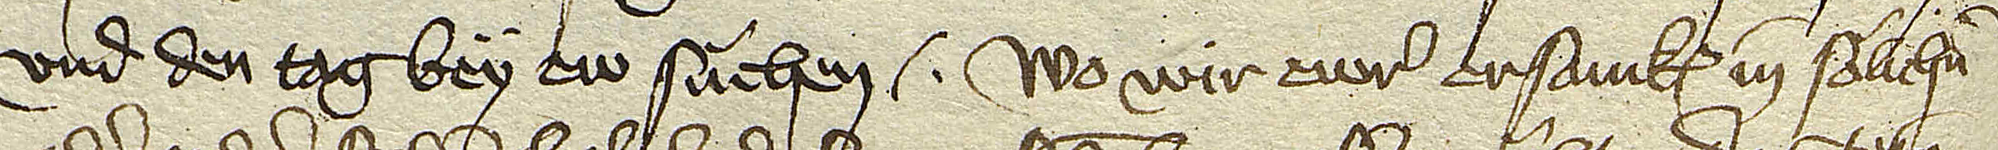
vnd den tag bey ew ſüchen / . wo wir ewr* erſamk* in ſölichn*
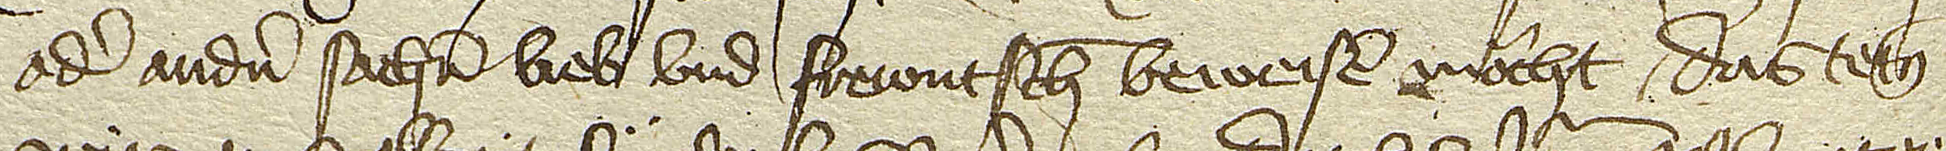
od* andn* ſachn* lieb vnd frewntſch* beweiſe* möcht / das tetn*
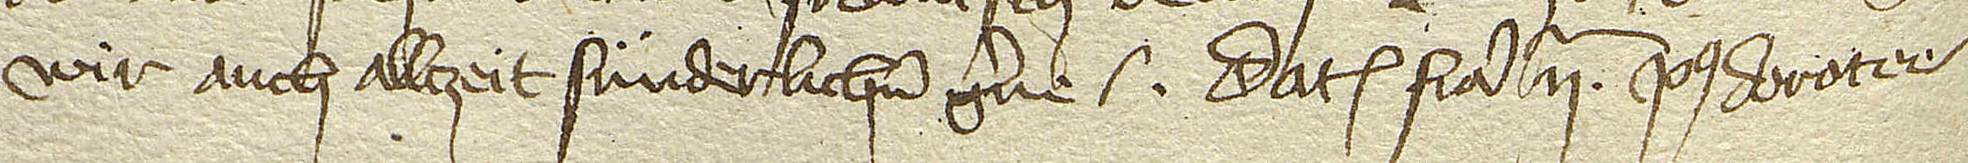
wir auch allcʒeit ſünderlichn* g*ne / . Dat* fia* ii* p* dorotee
